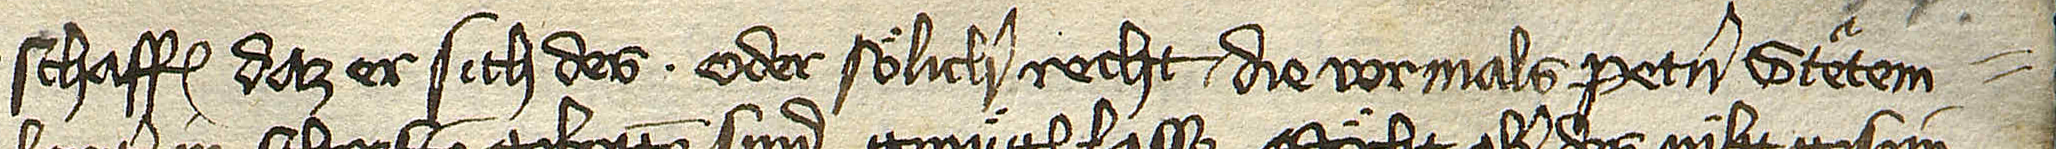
ſchaff* daʒ er ſich des . Oder ſölich* recht / die vormals Petn* Stëtem =
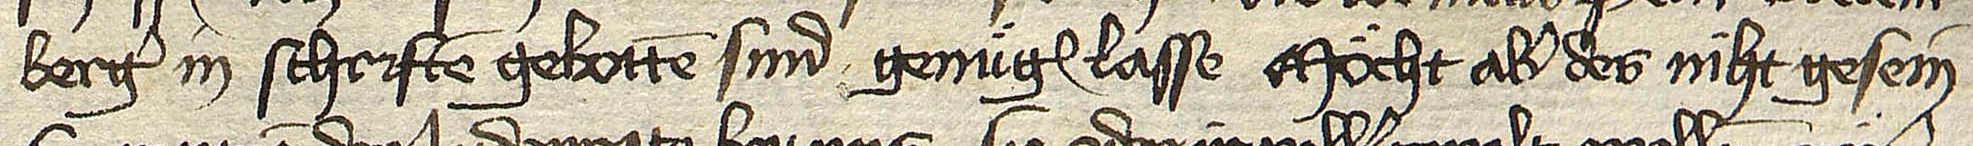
berg* in ſchrifte* gebotte* ſind genüg* laſſe Möcht ab* des niht geſein
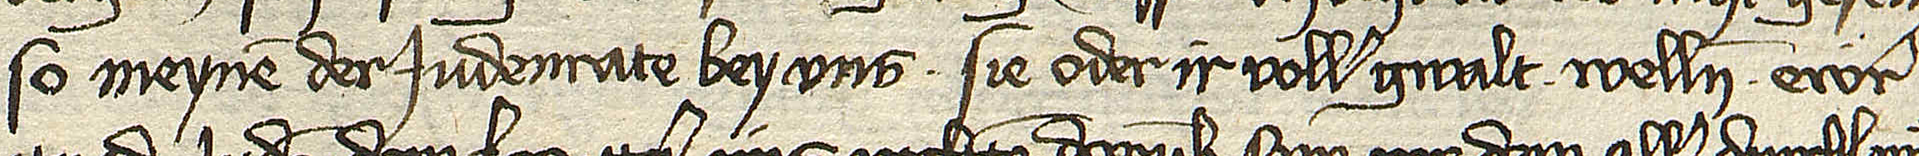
ſo meyne* der Iudenrate bey vns . ſie oder ir voll* gwalt . welln* . eẅr*
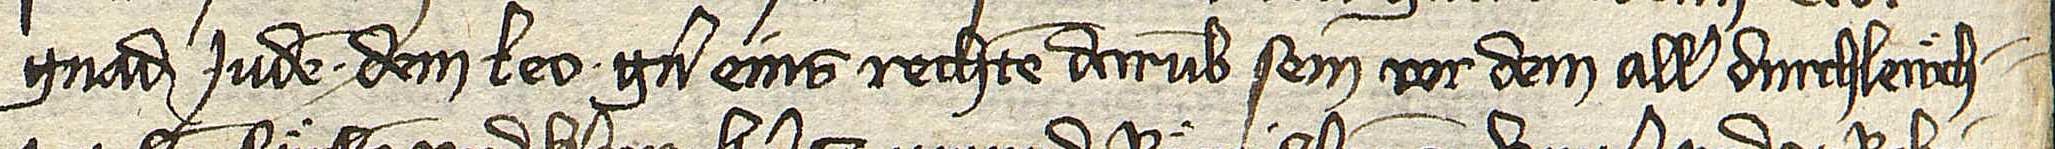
gnad* Iude* . dem leo gn* eins rechte* darub* ſein vor dem all* durchleẅch =
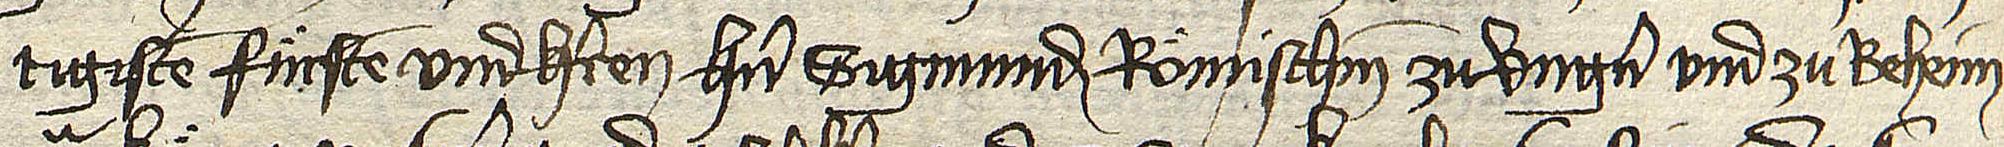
tigiſte* fürſte* vnd h*ren gn* Sigmund* Römiſchm* ʒu Vng*n vnd ʒu Beheim
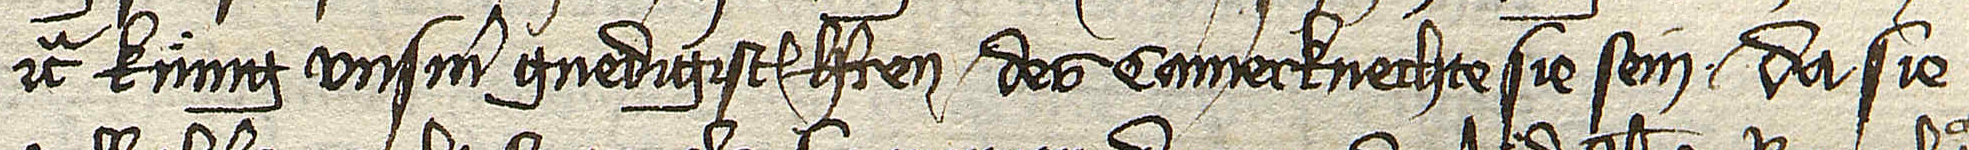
ec* künig vnſm* gnedigiſt* h*ren / des Camerknechte ſie ſein / Da ſie
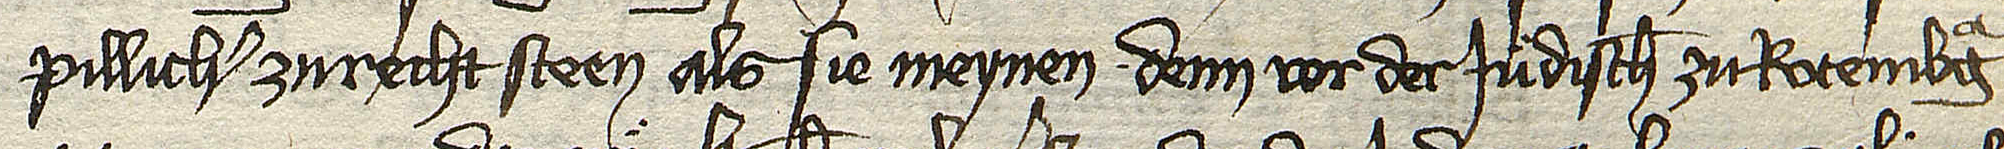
pillich* ʒurecht ſteen als ſie meynen . denn vor der Iüdiſch* ʒu Rotemb*g
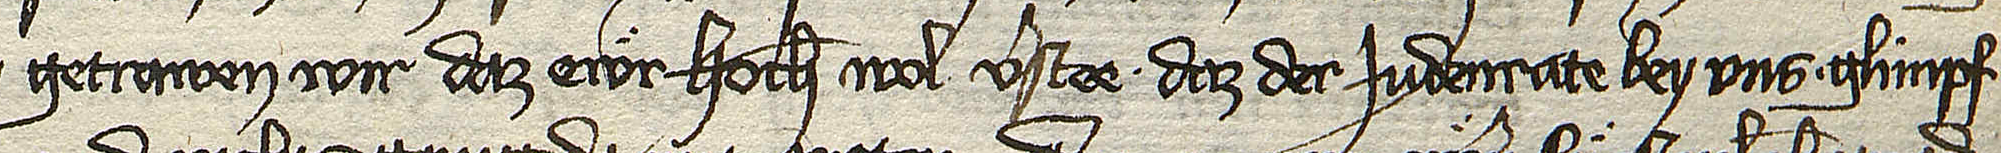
getrawen wir daʒ eẅr hoch* wol v*ſtee . daʒ der Iudenrate bey vns . glimpf
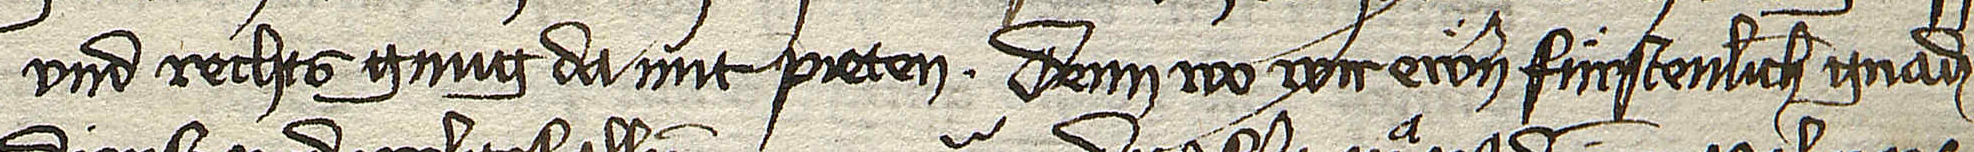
vnd rechts gnug da mit pieten . Denn wo wir eẅ*n fürſtenlich* gnad*
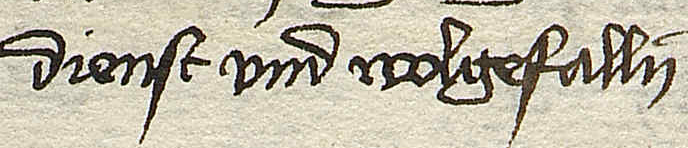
dienſt vnd wolgefalln*
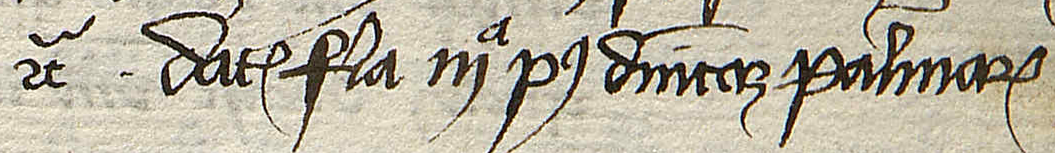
ec* Dat* fi*a iii* p* dni*ca* Palma*
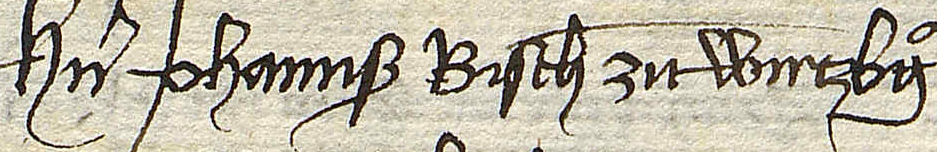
Hn* Iohannſ* Biſch* ʒu Wircʒb*g
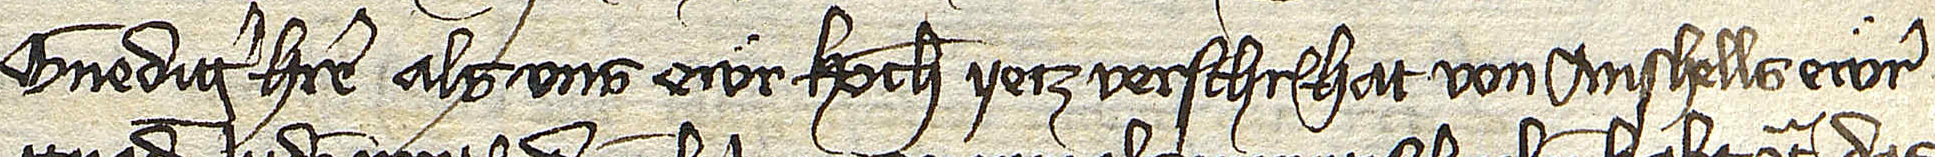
Gnedig* h*re als vns eẅr hoch* yecʒ verſchr* hat von Anſhells eẅr*
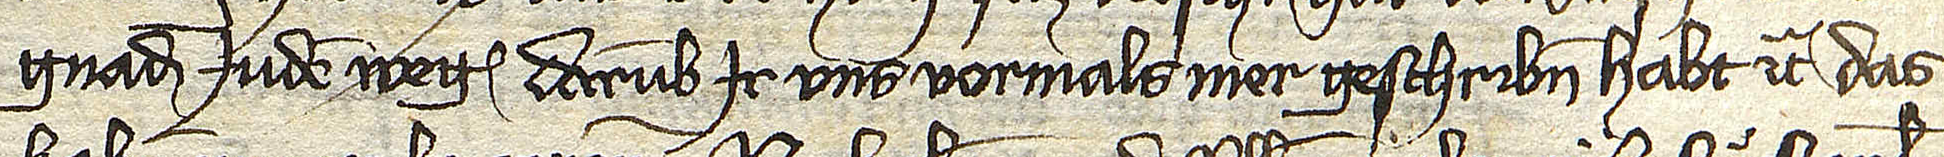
gnad* Iude* weg* Darub* Ir vns vormals mer geſchribn* habt ec* das
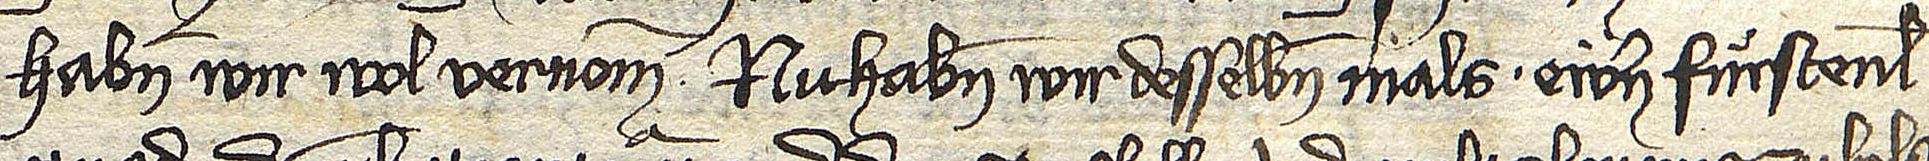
habn* wir wol vernom* . Nu habn* wir deſſelbn* mals . eẅ*n fürſtenl*
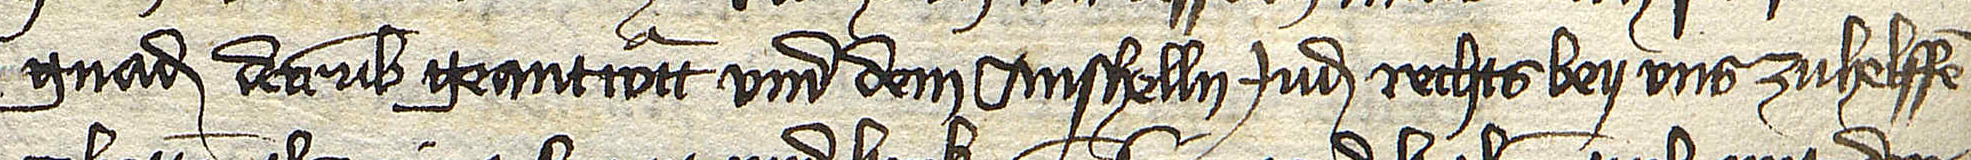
gnad* darub* geantw*tt vnd dem Anſhelln Iud rechts bey vns ʒu helffe*
